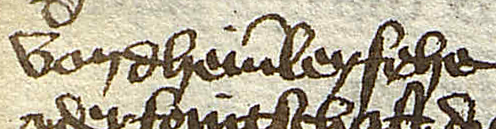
von dhein*ley fehe
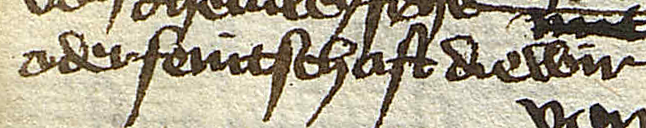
oder feintſchaft die wir
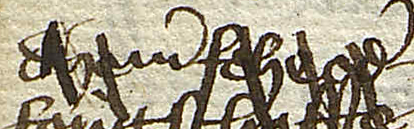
dh*ein* fehe od*
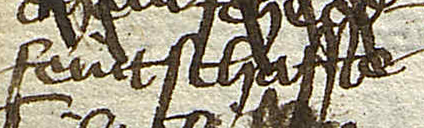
feintſchafte
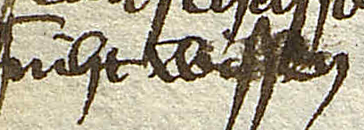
niht wiſſen
